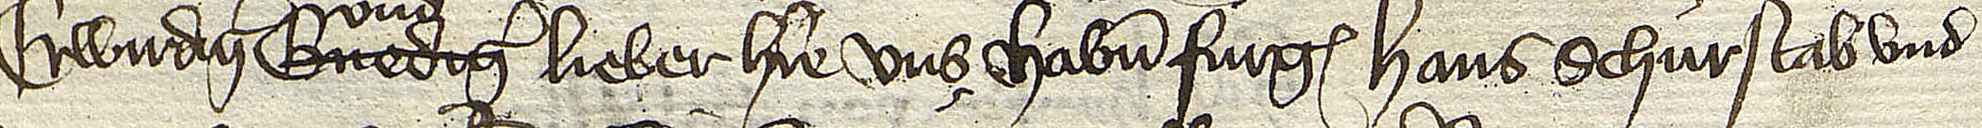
Erwirdig* Gnedig* lieber hre* vns hab*n fürg* hans Schürſtab vnd
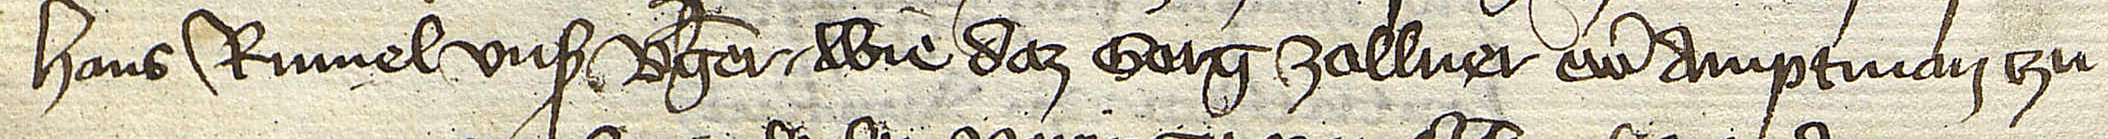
hans Rumel vnſ* B*ger / wie daʒ Görg cʒollner ew* Amptman cʒu
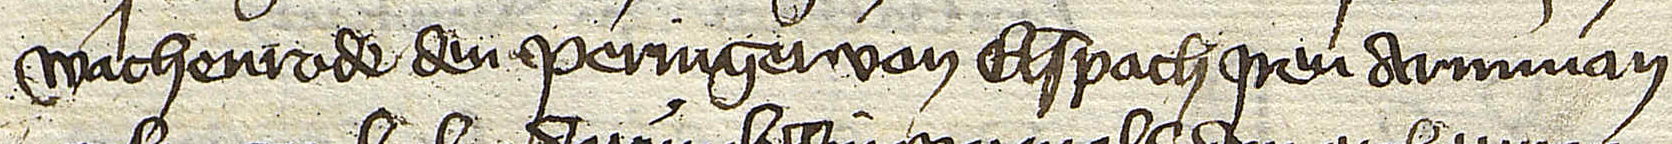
wachenrode den Perniger von Eſpach Iren Armman
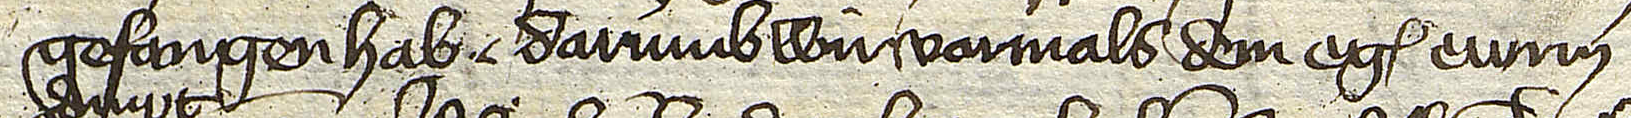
gefangen hab / darümb wir vormals dem eg* ewrm
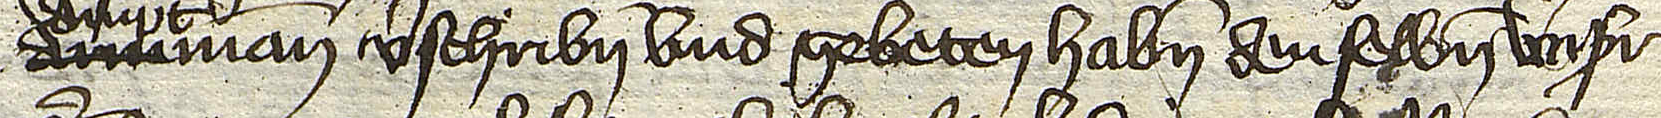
Armman* v*ſchrib*n vnd gebeten hab*n denſelb*n vnſ*r
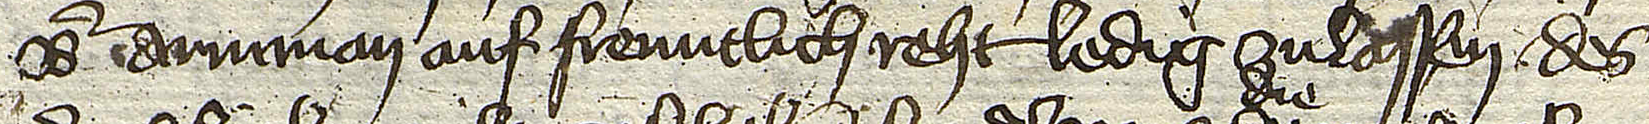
B* Armman auf freuntlich reht ledig cʒulaſſen / des
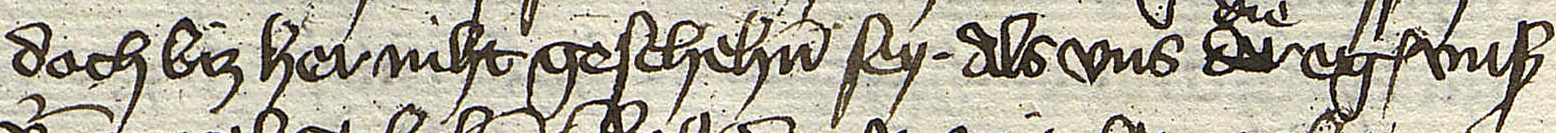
doch biʒ her niht geſcheh*n ſey . Als vns der eg* vnſ*
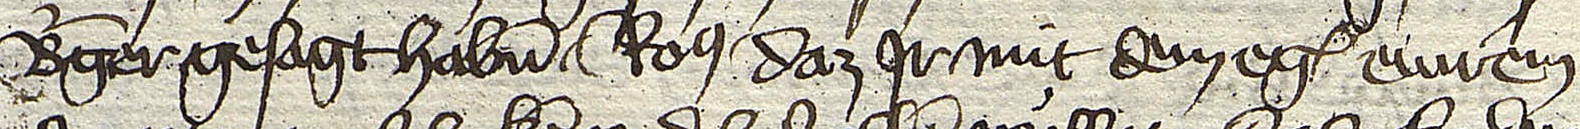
B*ger geſagt hab*n / Ro* / daʒ Ir mit dem eg* ewrem
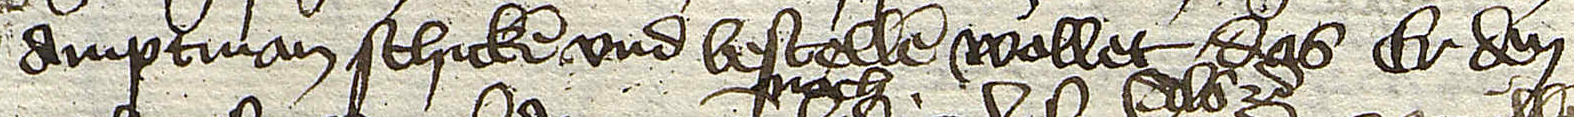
Amptman ſchicke* vnd beſtelle* wöllet / das Er den
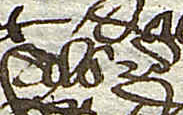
Als ec*
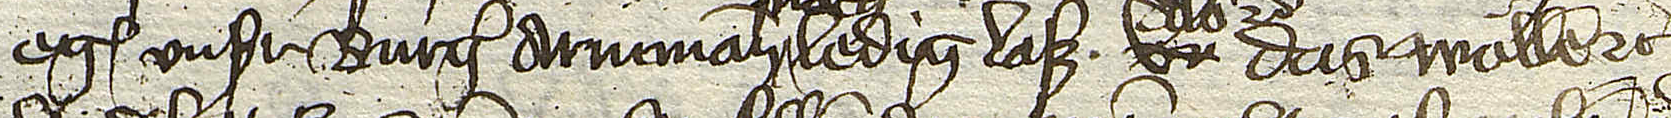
eg* vnſ*r Burg* Armman* ledig laſʒ . vn das wölle* ec*
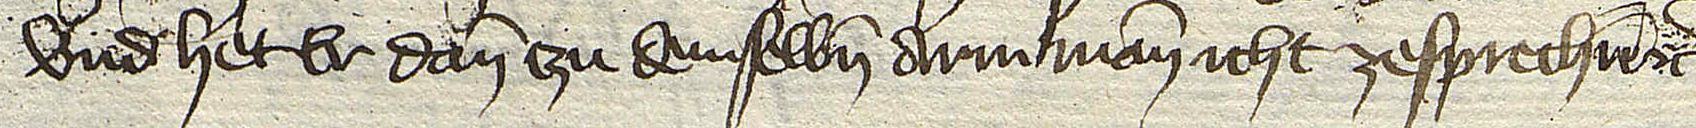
vnd het er dan* cʒu demſelb*n Armman* niht ʒeſprech*n ec*
